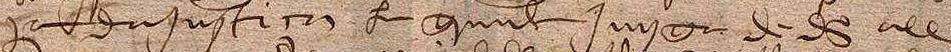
tsa da Justiça he grande Jmjga de dio all
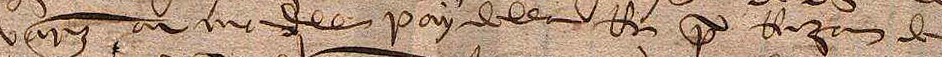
varez armadell pay della Re p̄o Rezam de
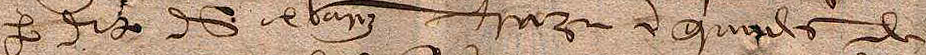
ho dito dio alvarez trazer ē grandes de
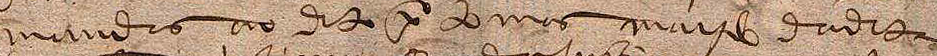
mandas ao dito p̄o tomas marjdo da dita
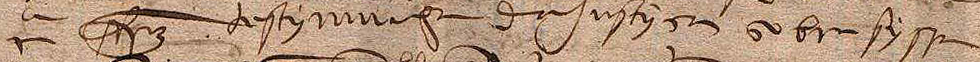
ca f̄frz testymunha da Justyça sobre syssa
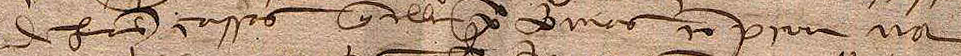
de huās cassas q̄ elle p̄o tomas c̄oprou na
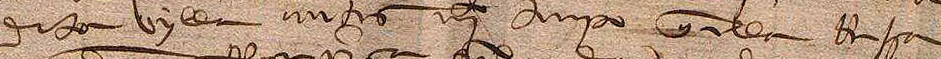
dita vylla antes mto tenpo q̄ ella Re Jsa
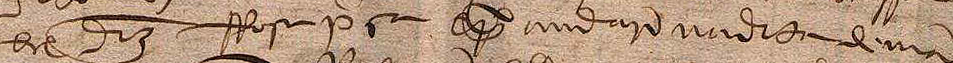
bel d̄iz ffose p̄sa e p̄o andarē na dita demā
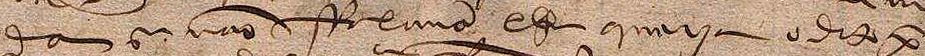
da se não ffalauā e lhe querja o dito p̄o
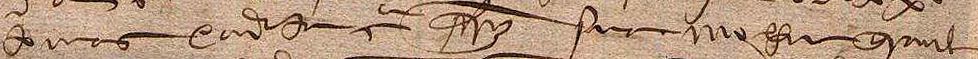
tomas e a dita ca f̄frz sua molher grande
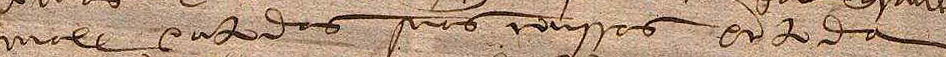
mall e a todas suas coussas e ē toda
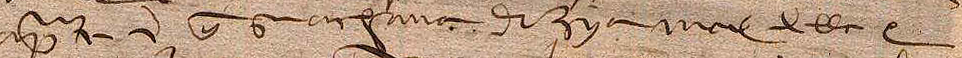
a p̄te ē q se achaua dizya mal della e
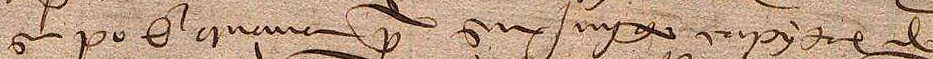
se pobiquaua p̄o seu Jmjgo capytal do
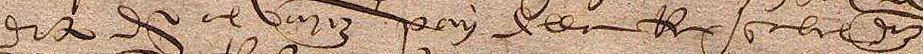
dito djo alvarez pay della Ree Jsabel d̄iz
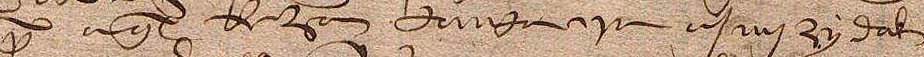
p̄o a q̄l Rezam tanta era a Jmjzydade
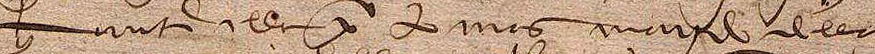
q̄ ante elle p̄o tomas marjdo della
